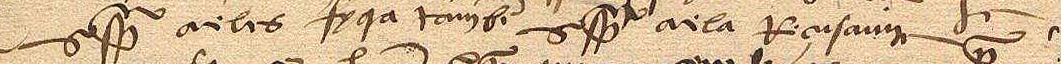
sospto a eles fyqa tambē sospto a ela Recusamte p̄o
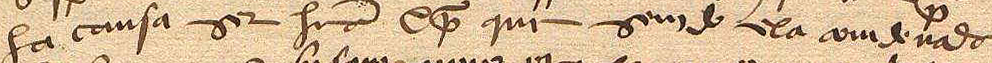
ha causa ser huā e p̄oque semdo ela comdenada
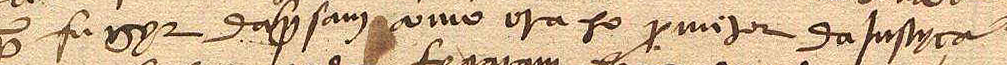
p̄o fugyr da p̄sam como ora ho ꝓmetor da Justyça
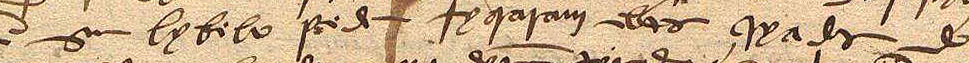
ē seu lybelo pede fyqaram eles cryados do
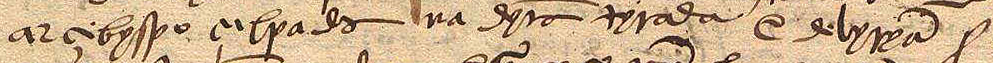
arcebyspo culpados na dyta tyrada e devyryā ꞩ
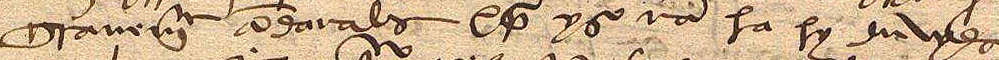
grauemte c̄odanados e p̄o yso nā ha hy duvyda
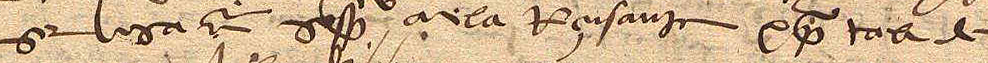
ser vosa m̄ sopto a ela Recusante e p̄o tall de
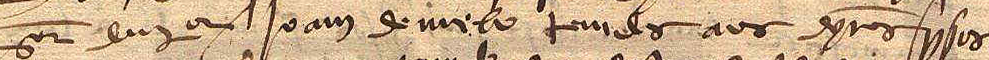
sōr doutor Joam de melo temdes aos dytos p̄sos
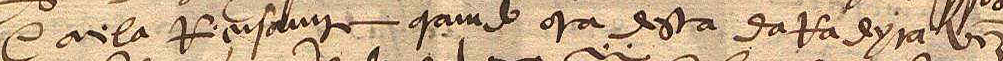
e a ela Recusamte qamdo ora desta daRadeyra vez
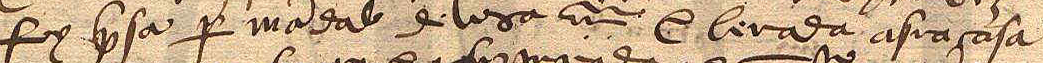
foy p̄sa ꝑ mādado de vosa m̄ e leuada a sua casa
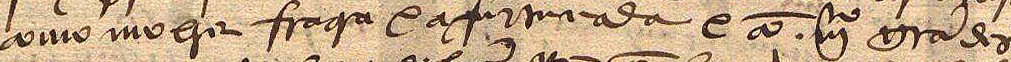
como molher fraqa e afurtunada e c̄o mto grādes
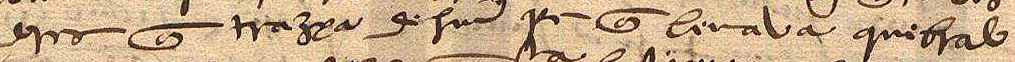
dores q̄ trazya de hū pe q̄ leuava quebrado
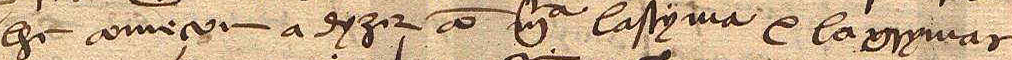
lhe começou a dyzer c̄o mta lastyma e lagrymas
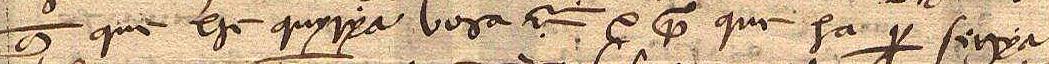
q̄ que lhe quyrya vosa m̄ e p̄o que ha ꝑsegya
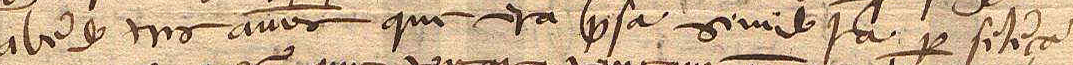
avēdo tres an̄os que era p̄sa semdo Ja ꝑ sētēça
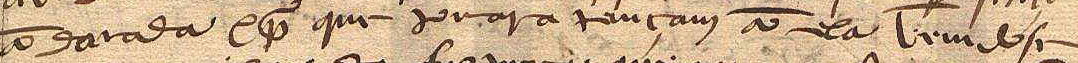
c̄odanada e p̄o que tomara temçam c̄o ela vemdose
